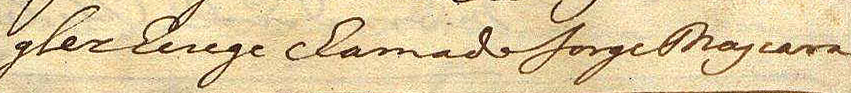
glez herege chamado Jorge Mascara
